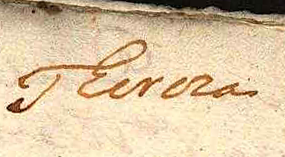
Thereza
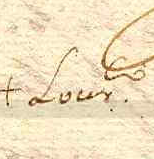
+ Lour.co
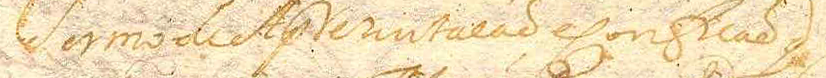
Termo de Aprezentaçaõ, e Confição q̄
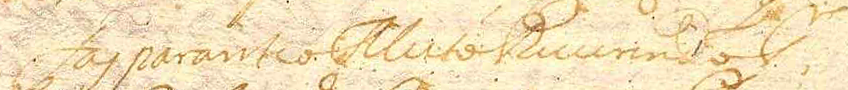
fas parante o Muto Reuerendo S.r
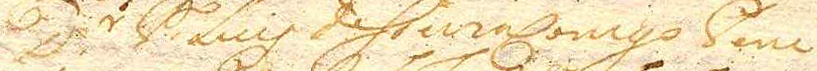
D.r P.o Luis de sousa Conego Peni
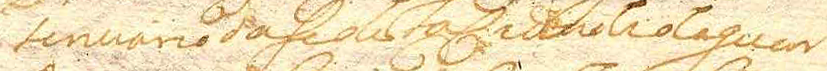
tenciario da se desta Cidade da guar
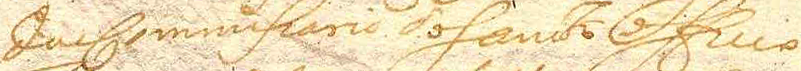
da e Commissario do santo officio
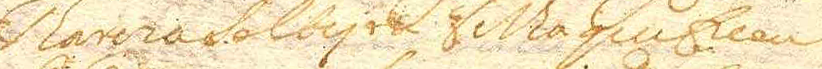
Thereza Soltejra filha que ficou
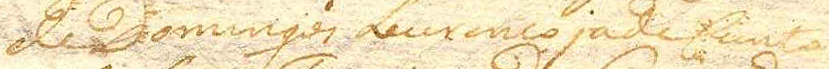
de Domingos Lourenço ja defunto
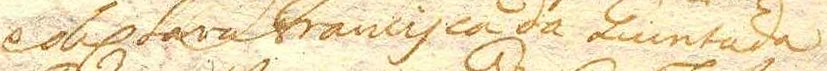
e de Clara Francisca da Quinta da
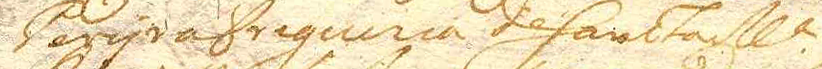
Perejra freguezia de sancta M.a
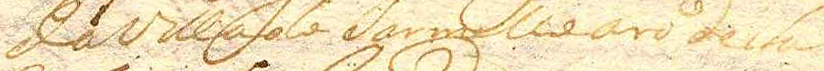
da Villa do Iarmello aro desta
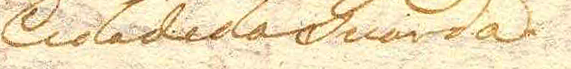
Cidade da Guarda.
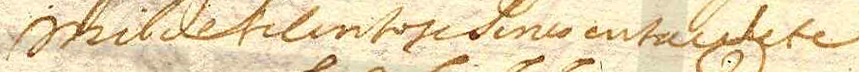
mil setecentos e sincoenta e sete
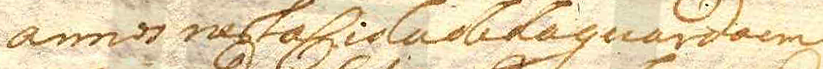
annos nesta Cidade da guarda em
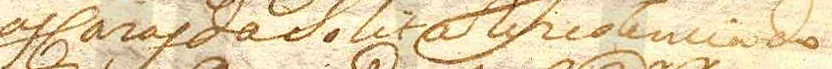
as Cazas da Solita Rezedencia do
